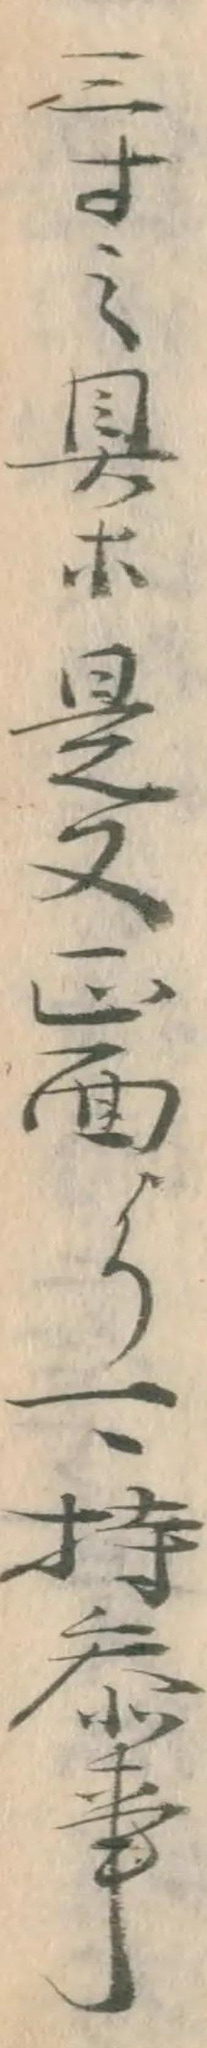三寸之具等是又正面より可持参事

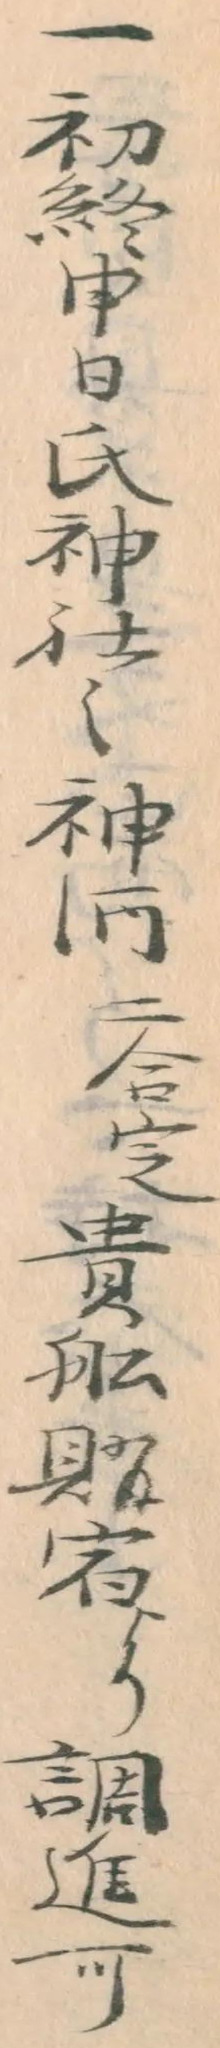一初終申日氏神社之神酒二合定貴舩賄宿より調進可
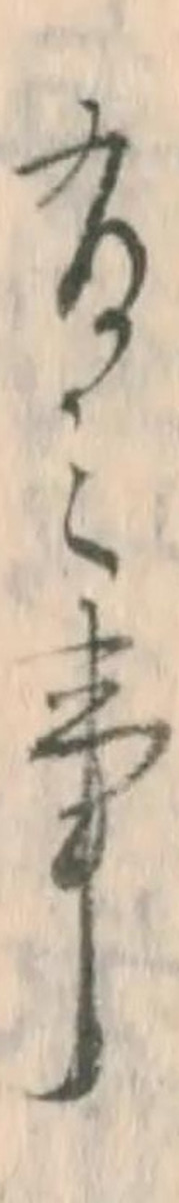有之事
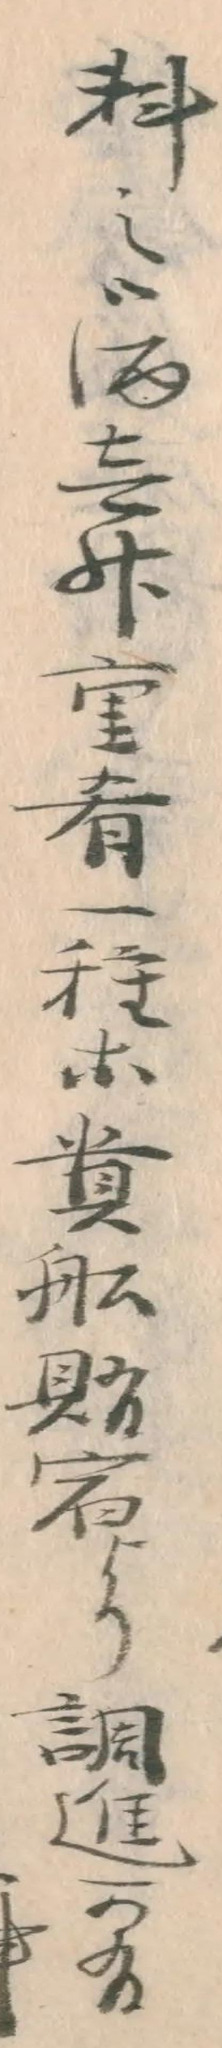科之御酒壱升重肴一種等貴舩賄宿より調進可有之事
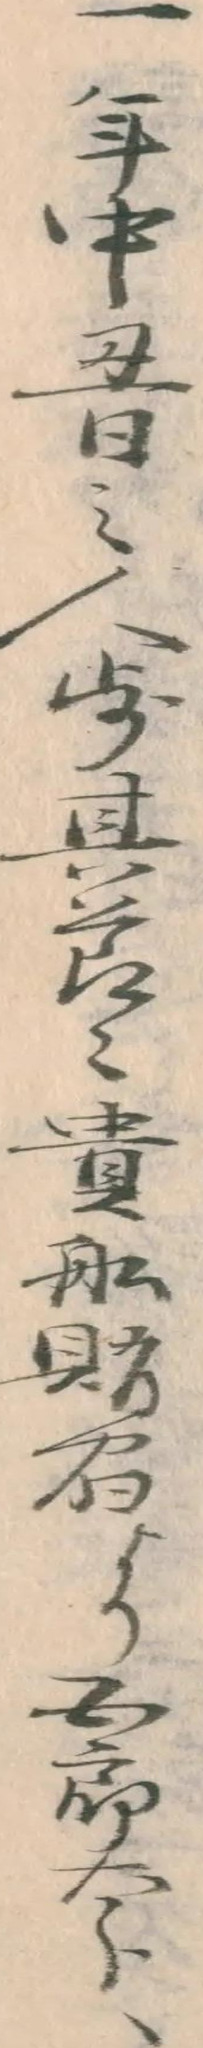一年中丑日之人歩其節々貴舩贈宿より五郎太郎へ
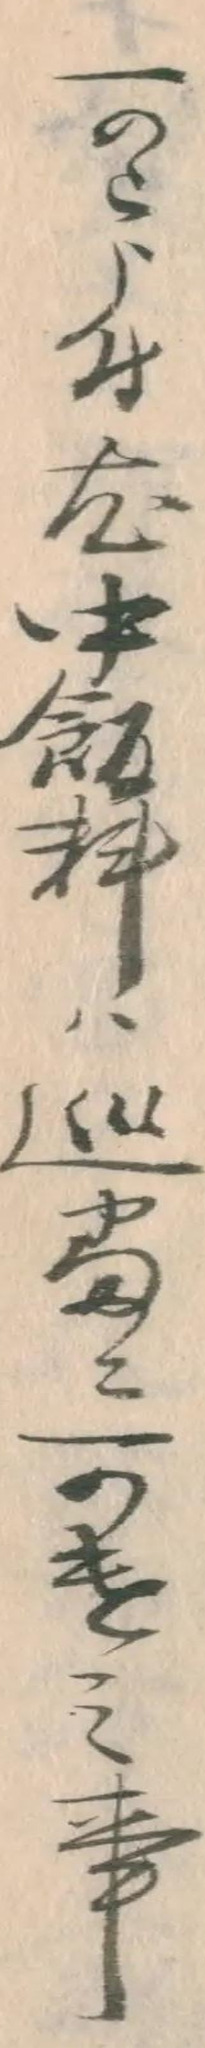可被申付尤中飯料ハ巡番ニ可遣之事
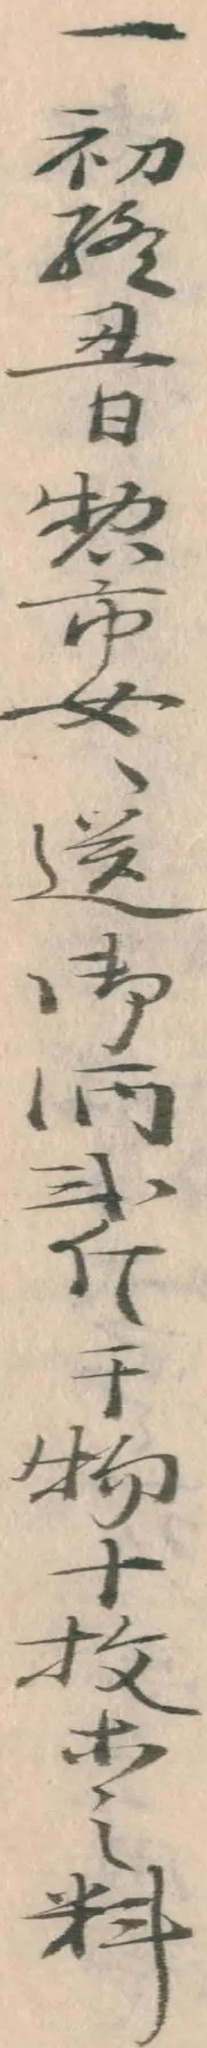一初終丑日惣市女へ送御酒弐斤干物十枚等之料
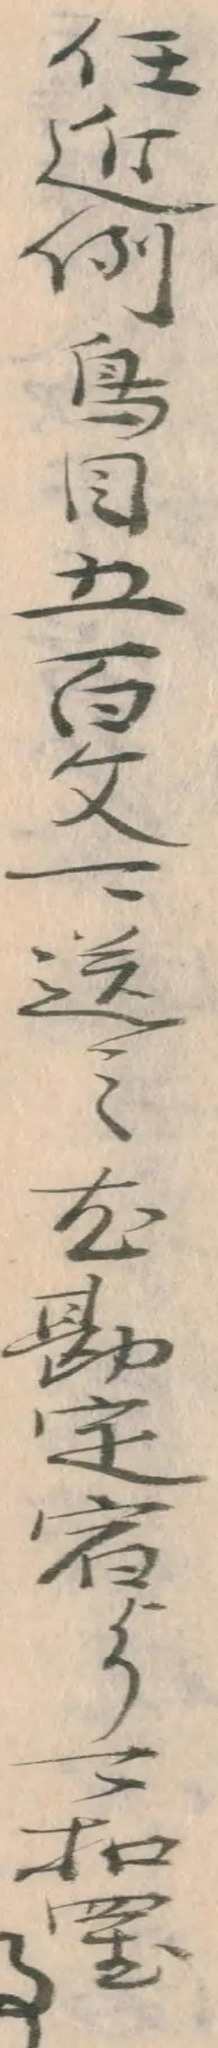任近例鳥目五百文可送之尤勘定宿より可扣置事
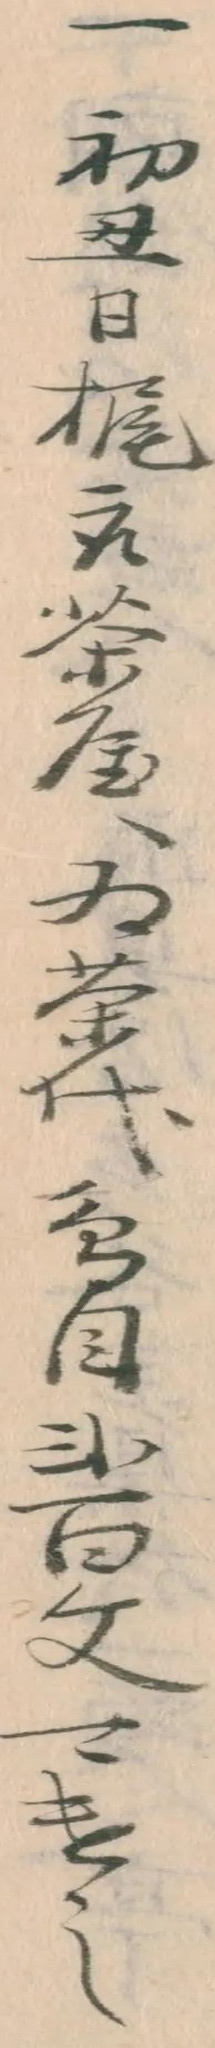一初丑日梶取茶屋へ為茶代鳥目弐百文可遣也
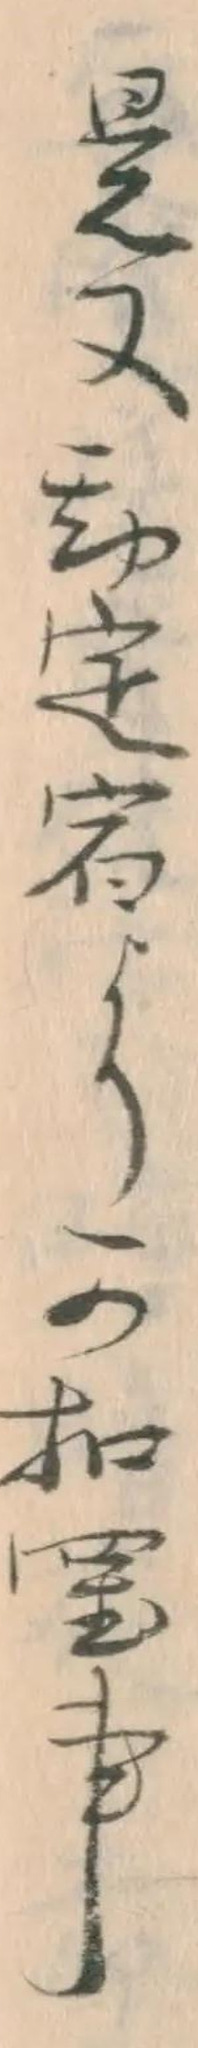是又勘定宿より可扣置事
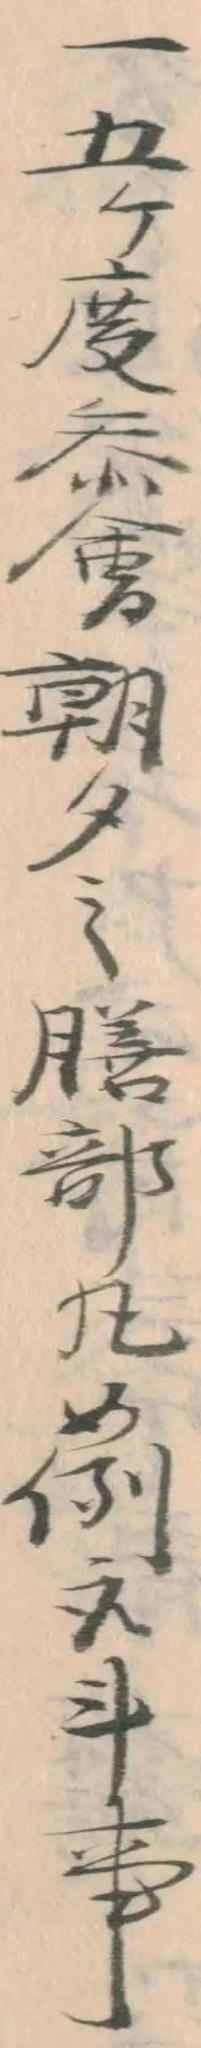一五ヶ度参會朝夕之膳部凡如例取斗事
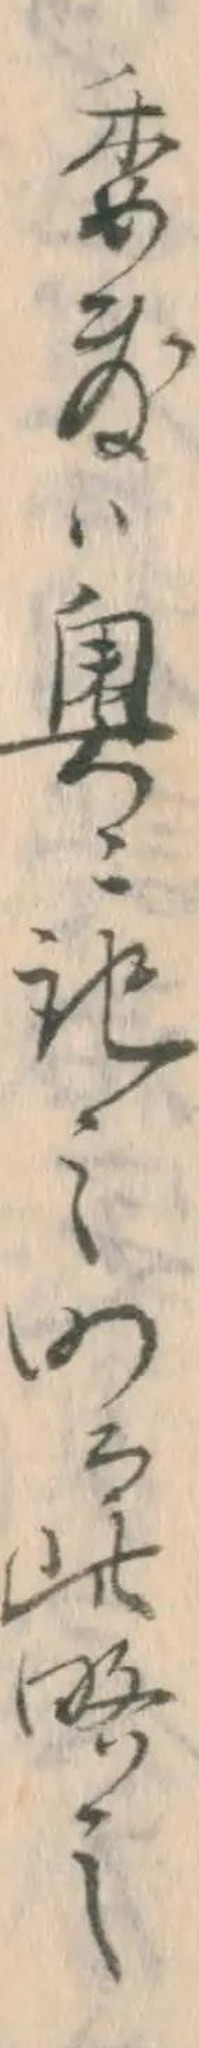委敷は奥ニ記之仍而此略之
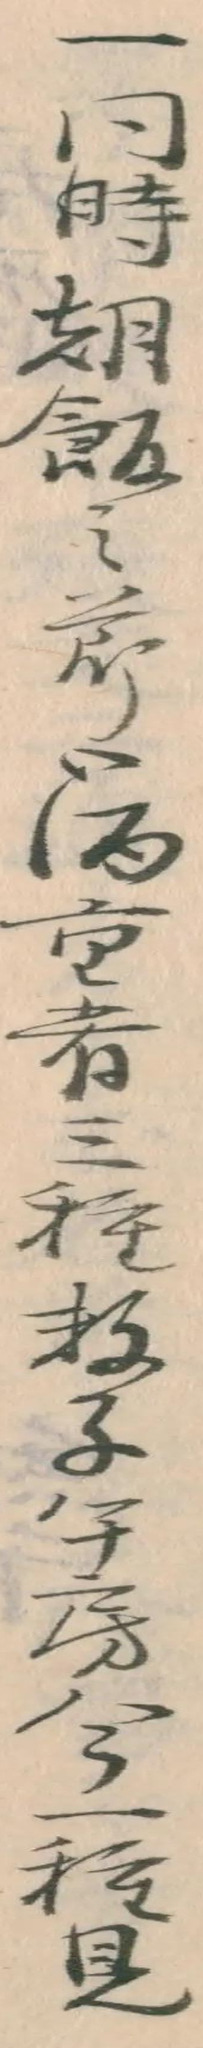一同時朝飯之節御酒重肴三種数子牛房今一種見
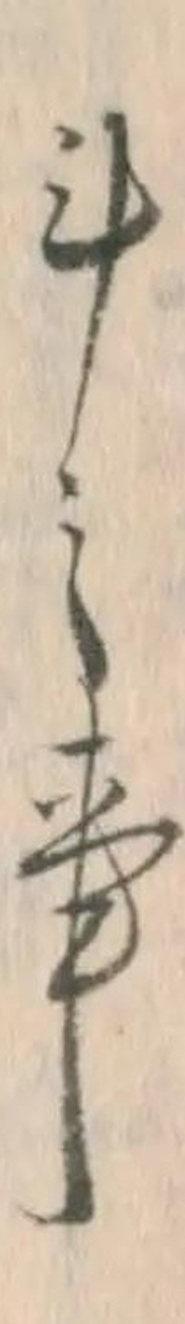斗之事
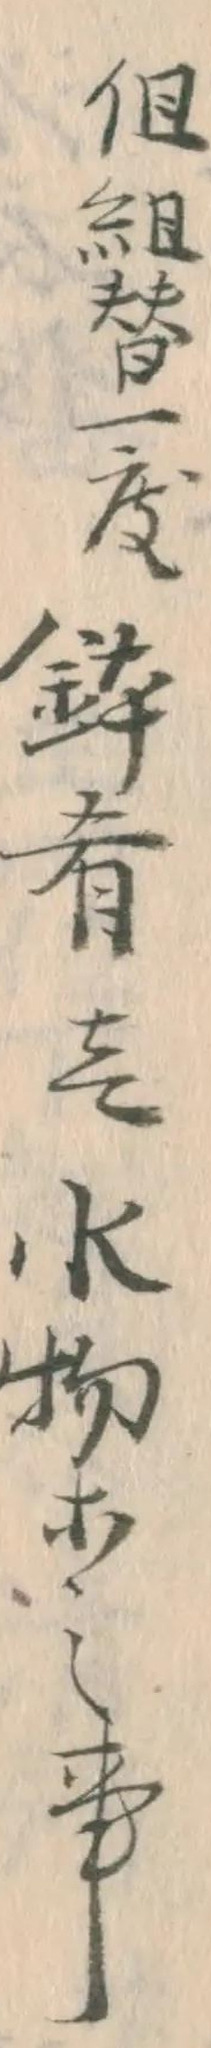但組替一度鉢肴壱水物等之事
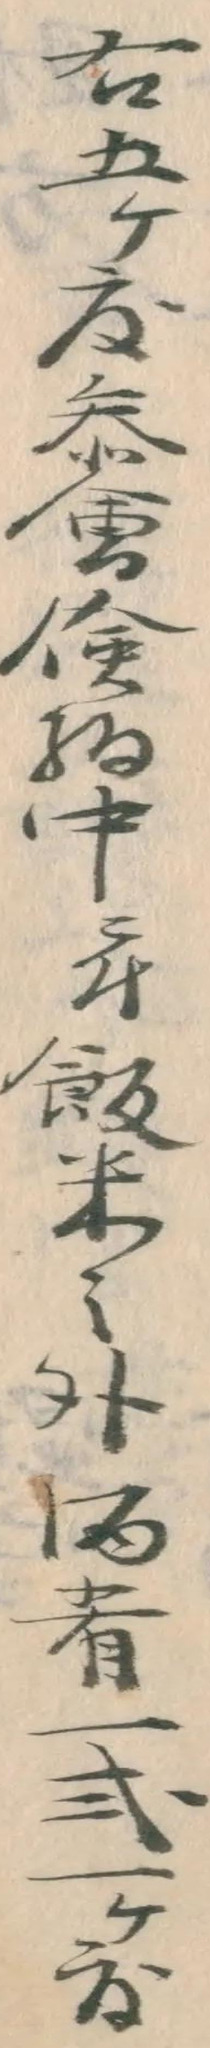右五ケ度参會倹約中ニ付飯米之外酒肴一式一ケ度
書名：賀茂社記録. 第72冊
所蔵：国立国会図書館 National Diet Library, JAPAN
